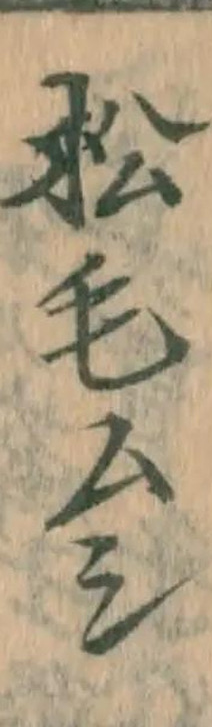松毛ムシ
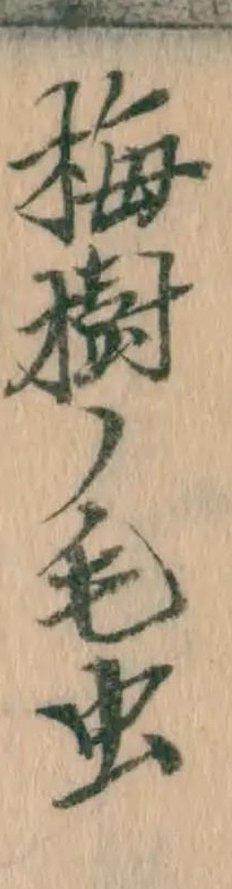梅樹ノ毛虫

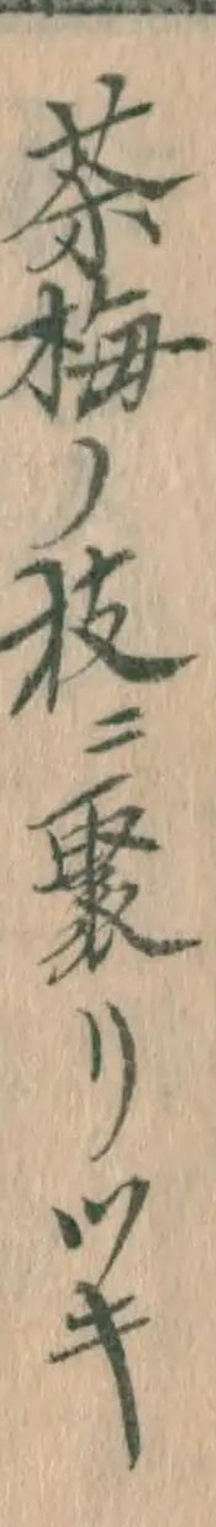茶梅ノ枝ニ聚リツキ
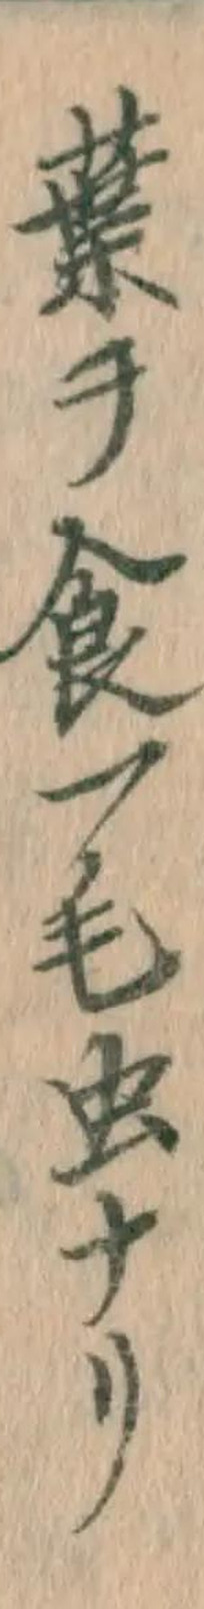葉ヲ食フ毛虫ナリ
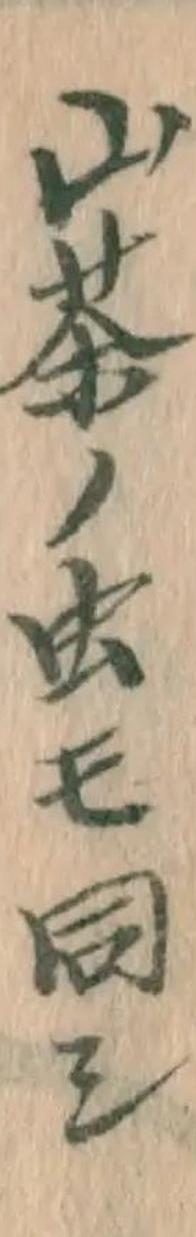山茶ノ虫モ同シ
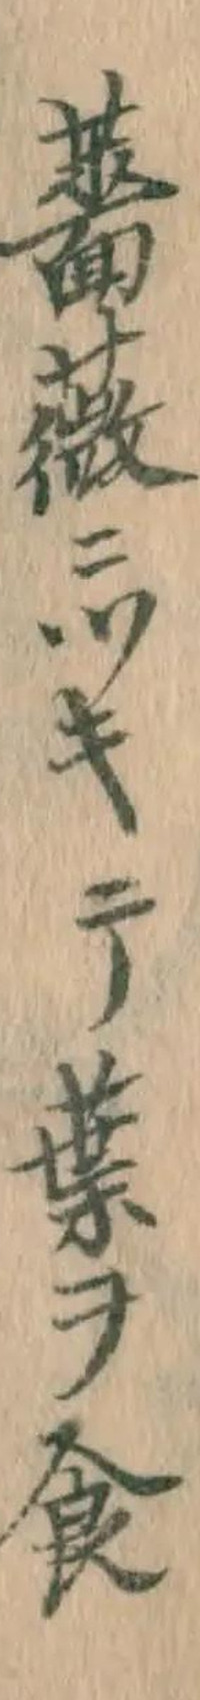薔薇ニツキテ葉ヲ食
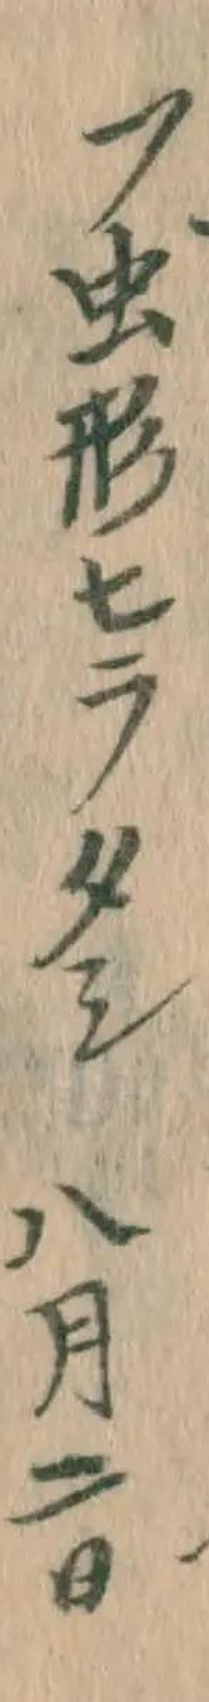フ虫形ヒラタシ八月二日
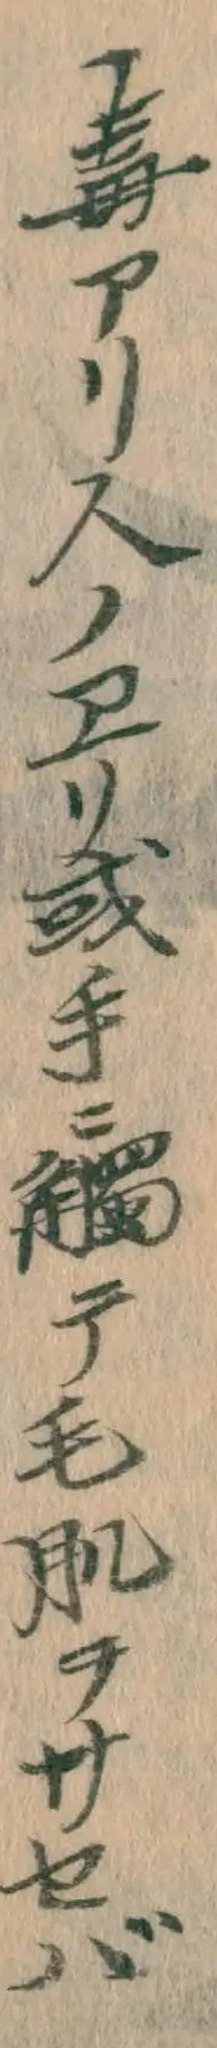毒アリ人ノヱリ或手ニ觸テ毛肌ヲサセバ
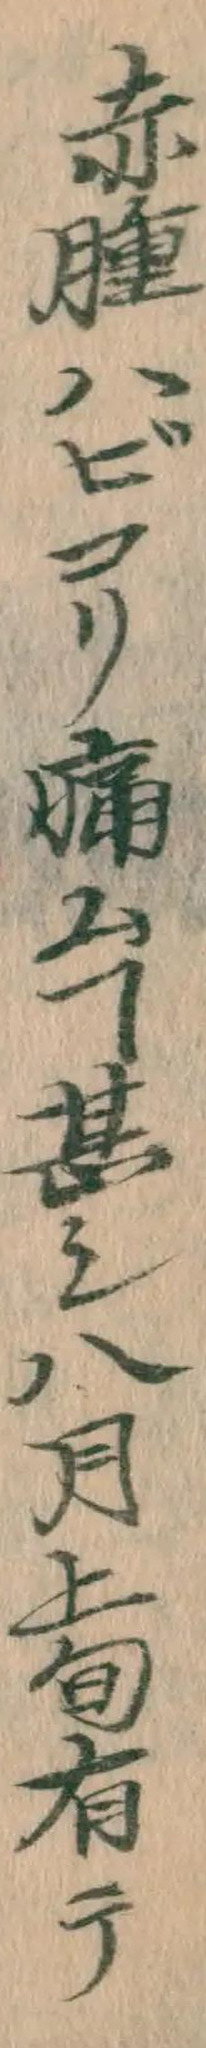赤腫ハビコリ痛ムコト甚シ八月上旬有テ
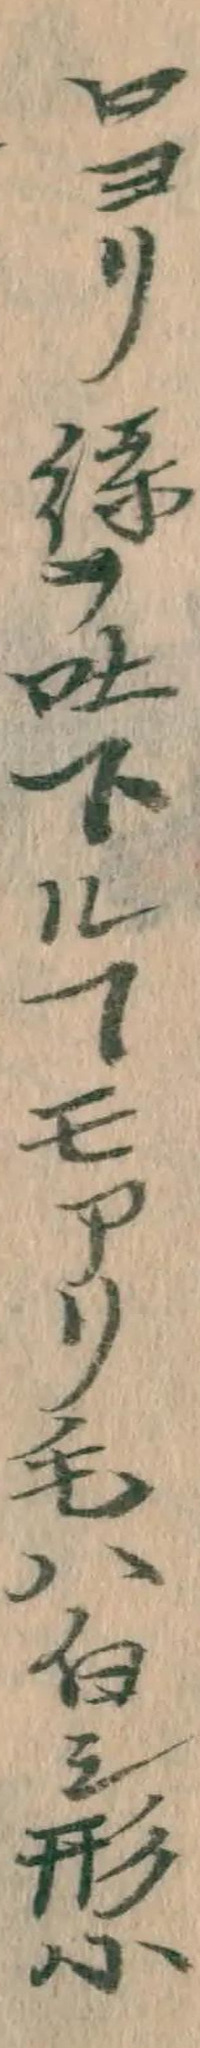口ヨリ絲ヲ吐下ルコトモアリ毛ハ白シ形小
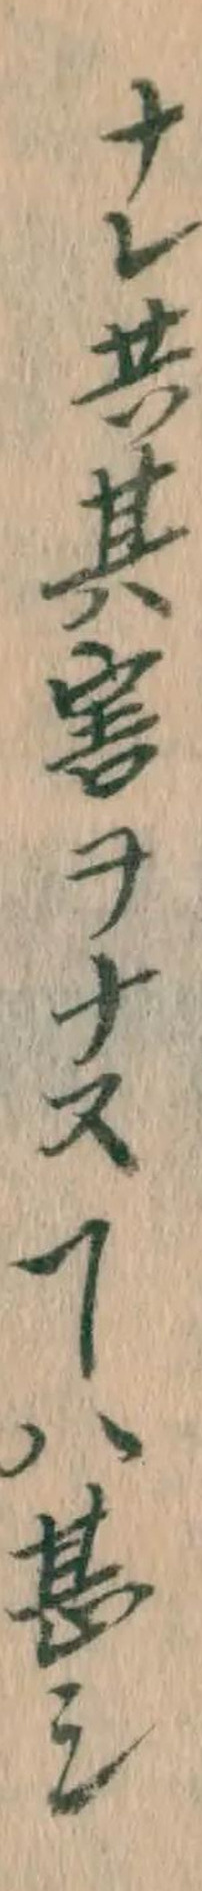ナレ共其害ヲナスコトハ甚シ
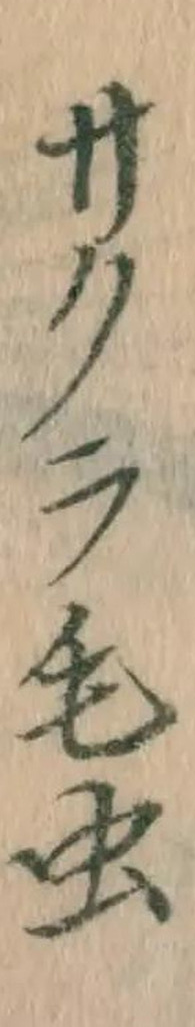サクラ毛虫

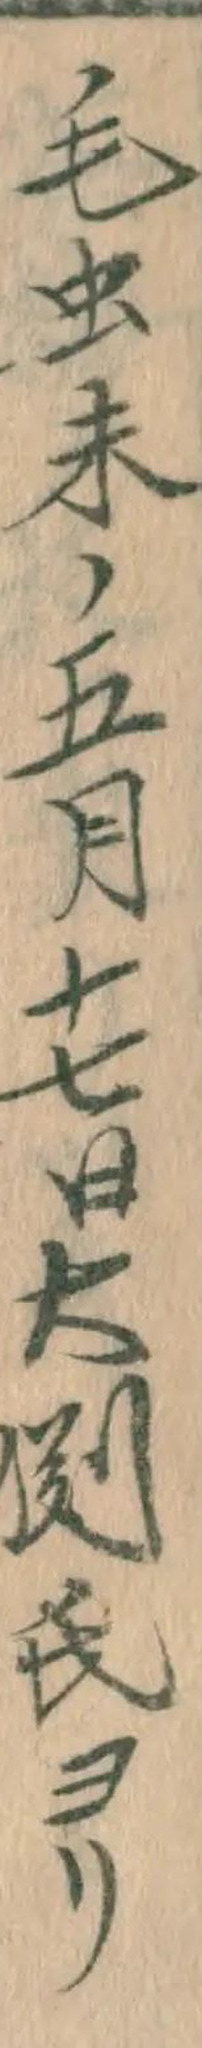毛虫未ノ五月十七日大渕氏ヨリ
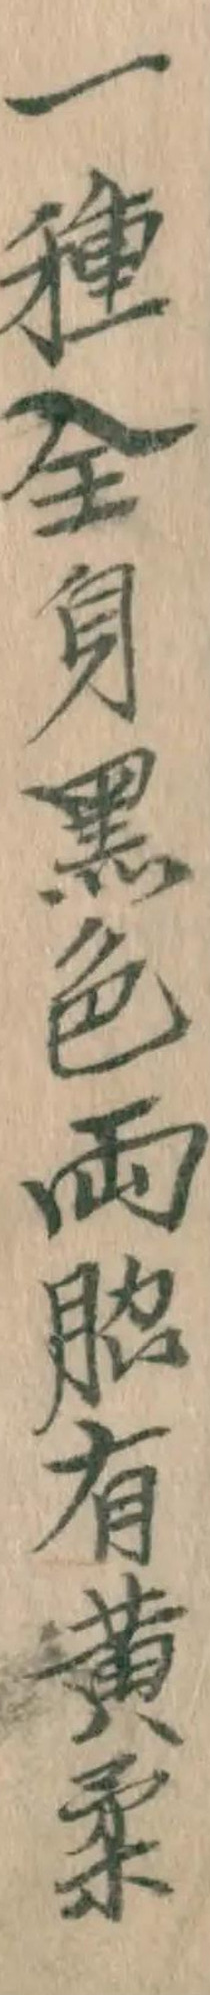一種全身黒色両脇有黄柔
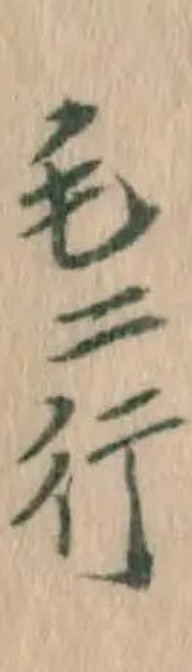毛二行
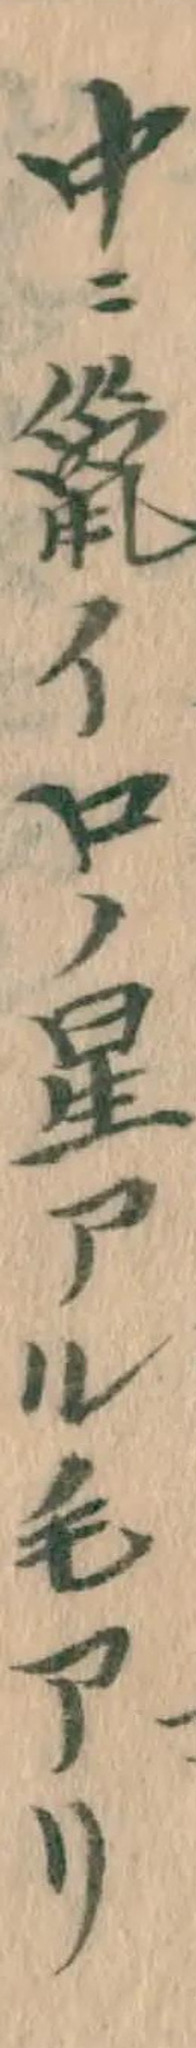中ニ鼠イロノ星アル毛アリ
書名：千蟲譜 3巻. [1]
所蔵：国立国会図書館 National Diet Library, JAPAN
